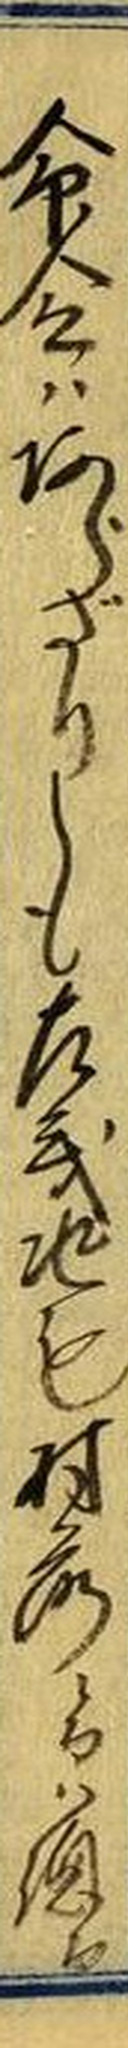命令ハあらざりしも左義兆も村落ニ而ハ総而
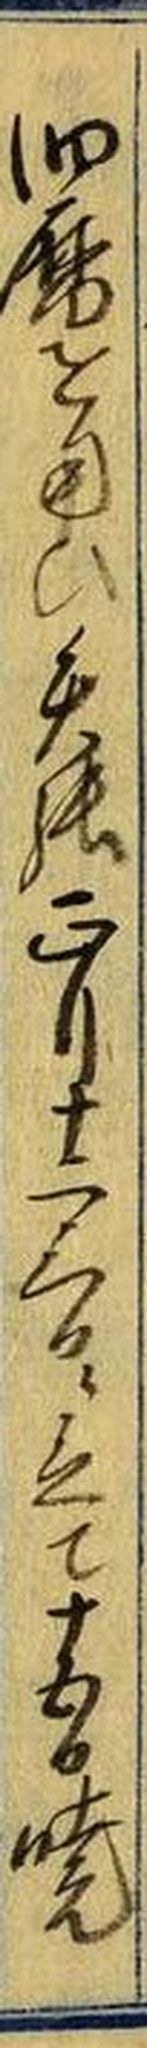旧暦を用ひ矢張り正月十三日ニ立て十五日暁
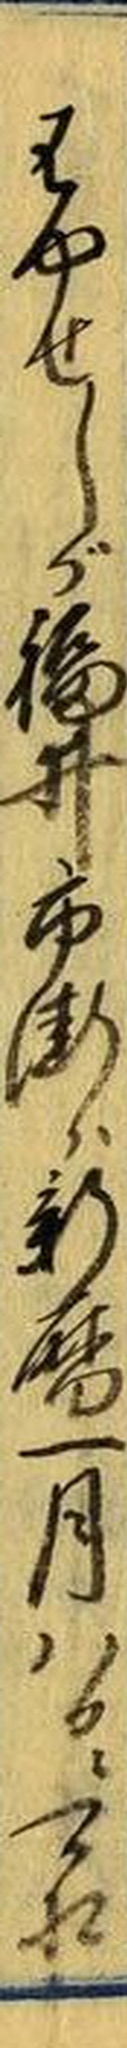はやせしが福井市街ハ新暦一月八日ニ可相
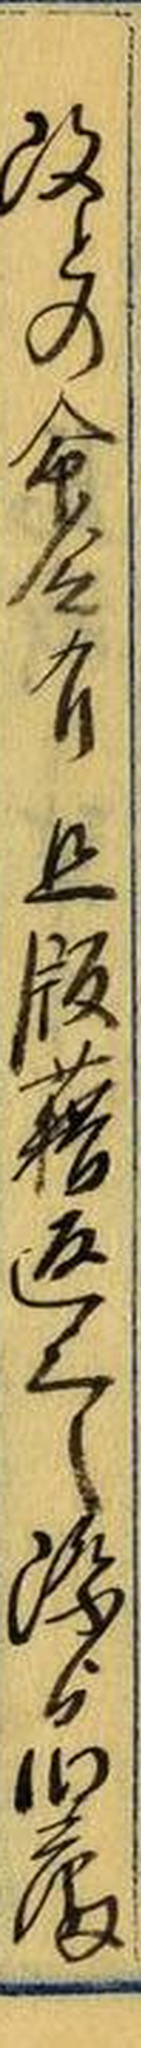改との命令有之且版籍返上之際ゟ旧藩
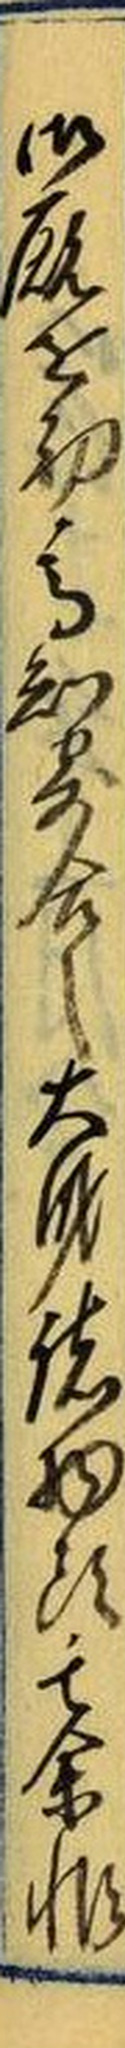御厩を初高知寄合之大身諸物頭其余非
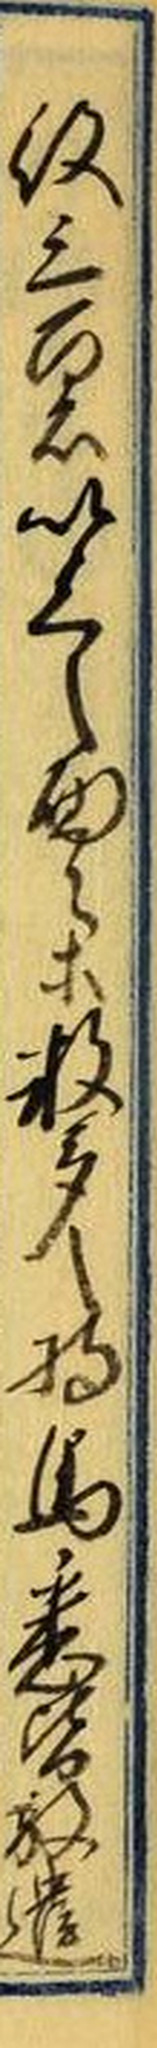役三百石以上之面々等数多之持馬悉皆放遣
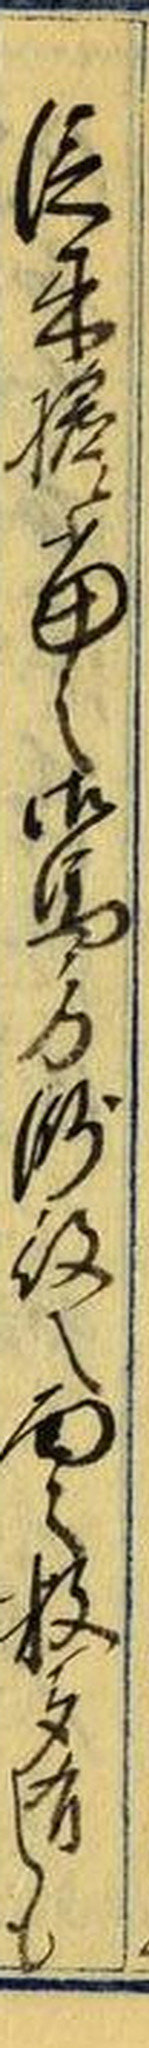従来担当之御馬方師役之面々数多有しも
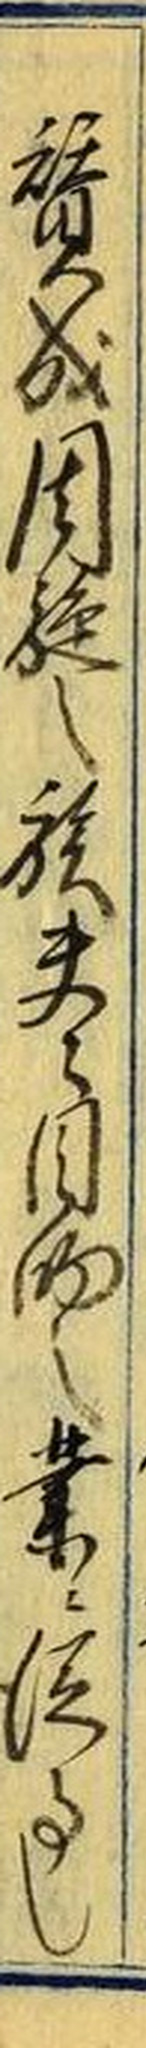賛成周旋之族夫々目的之業ニ従事し
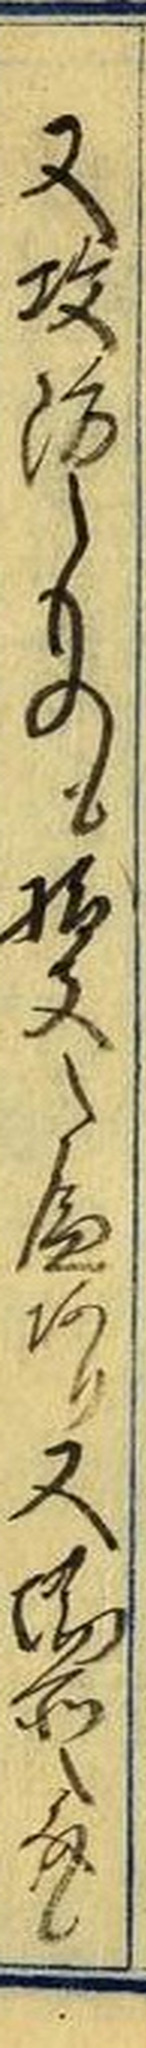又攻防之ものも指支之廉あり又場所之義も
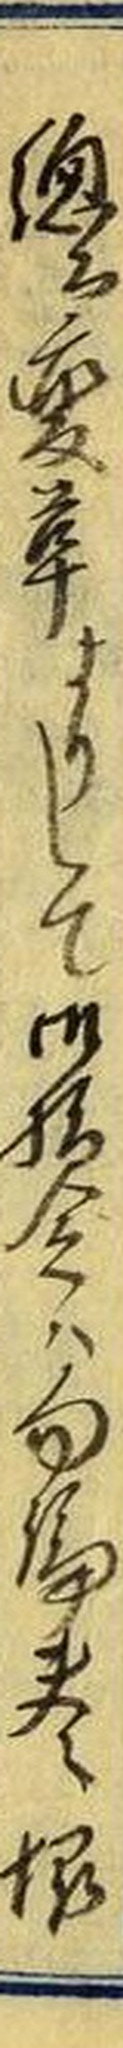総而変革よりして御指令ハ勿論夫々協
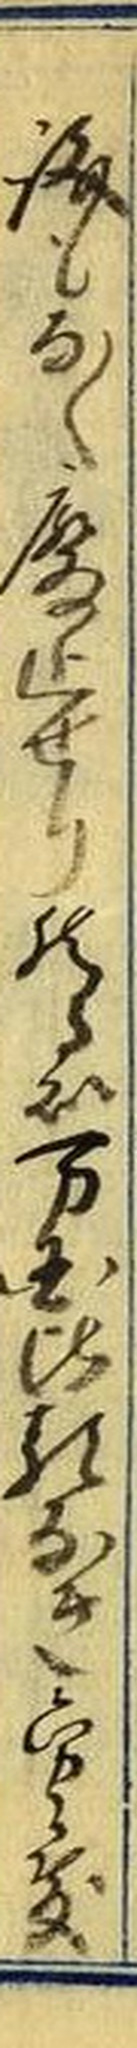議もなく廃止せり然る処万国比類なき勇々敷
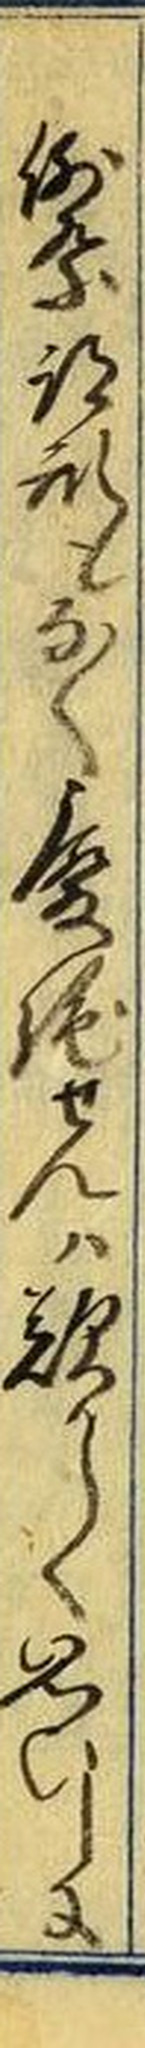例祭跡形ももなく廃絶せんハ歎ハしく思ひしに
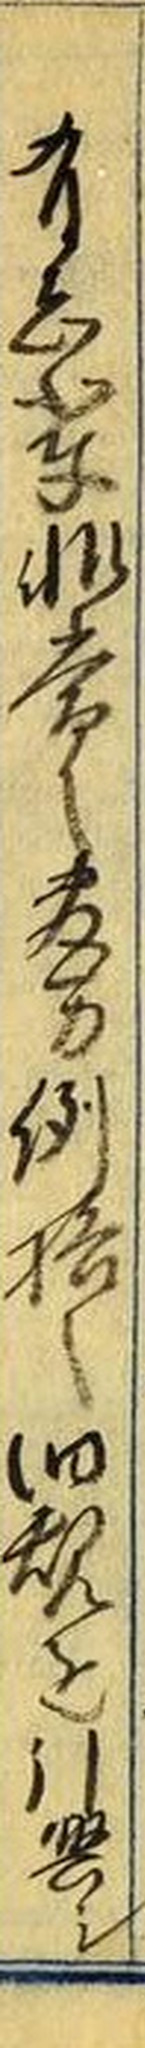有志輩非常之尽力例格之旧規を引興シ
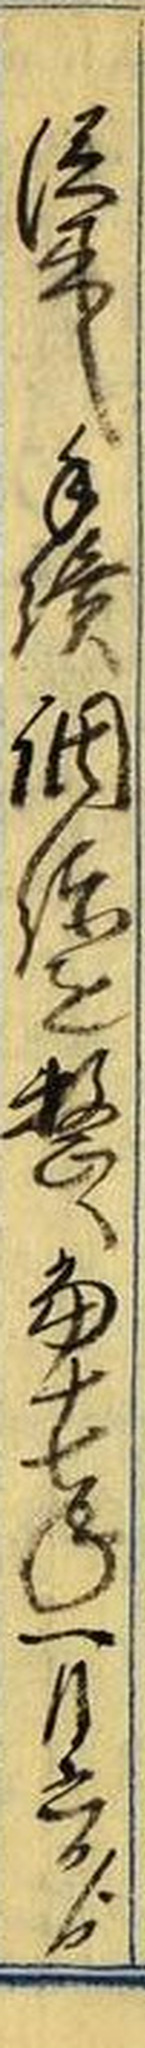従事し手続調練を整へ当十七年一月六日ゟ
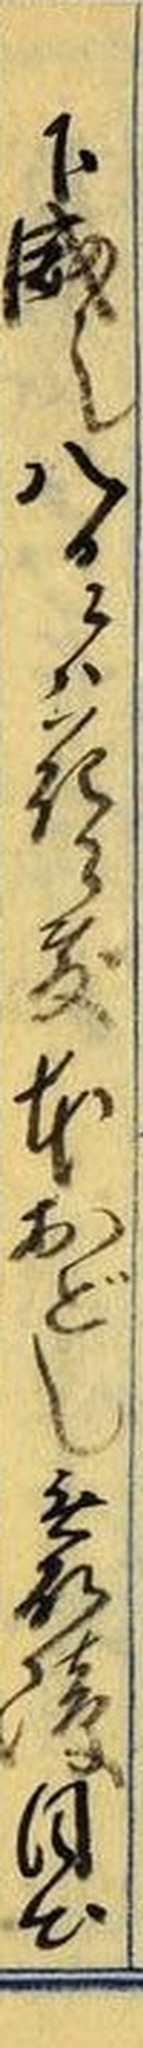下威し八日ニハ花々敷本おどし無故障目出

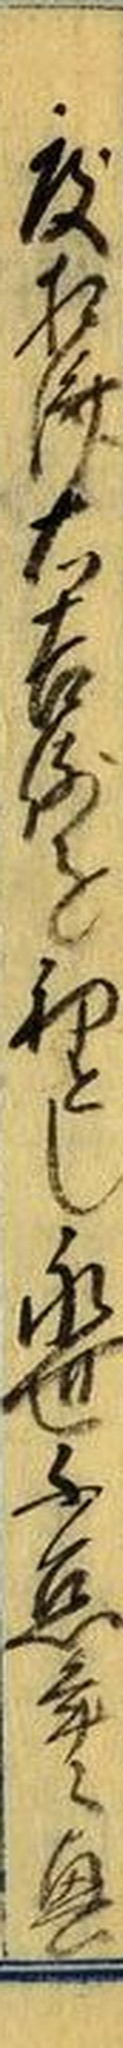度相済右吉例を初とし永世不怠年々興
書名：温古集 五巻
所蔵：福井県文書館 Fukui Prefectural Archives
